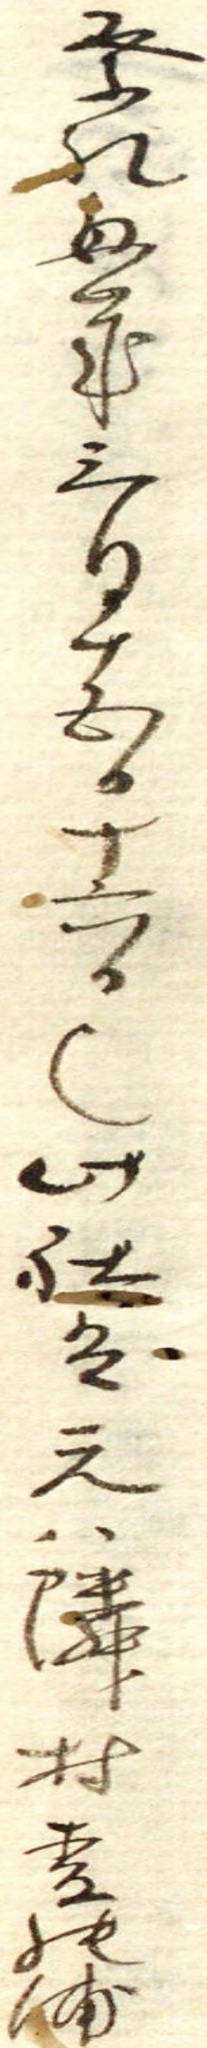祭礼毎歳三月十五日十六日也此社は元は隣村麥の浦
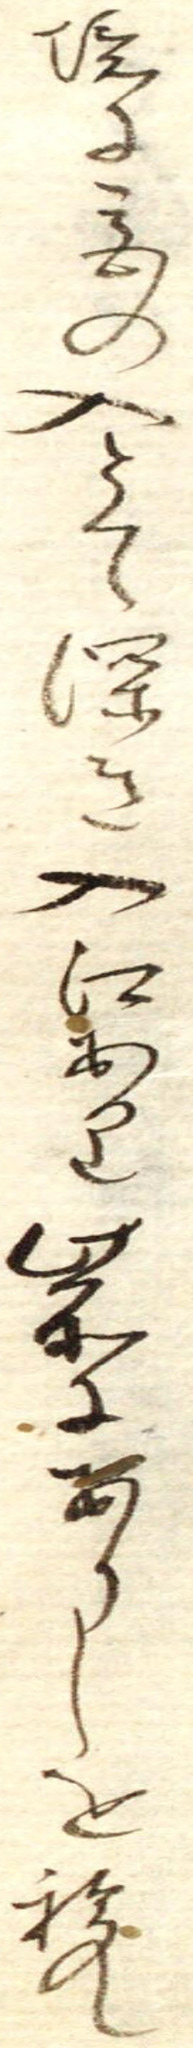境に宮の入とて深き入江あり此所にありしを移し
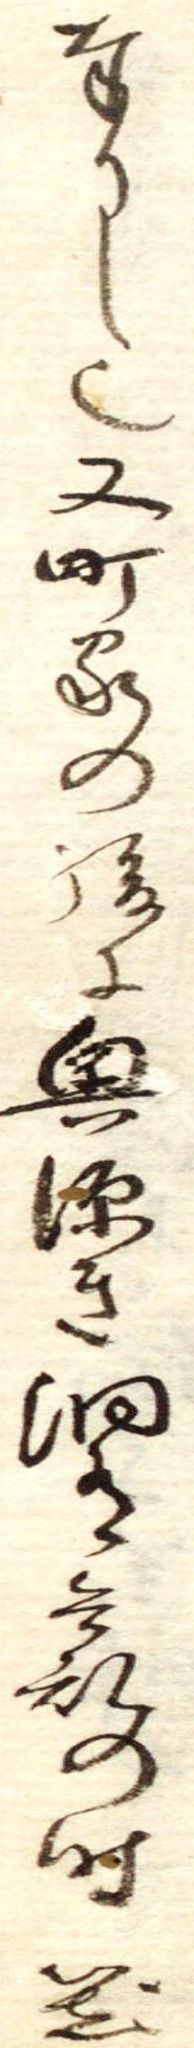奉りし也又町家の後に奥深き洞有兵乱の時器
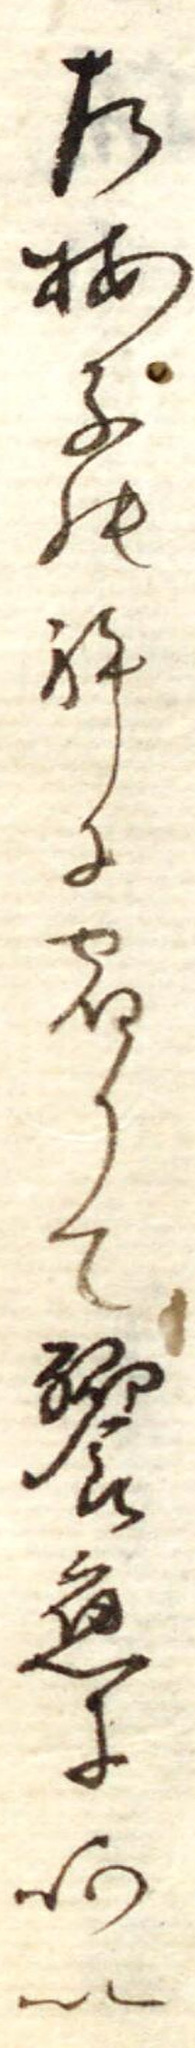左桜子の躰に宿りて饗応にあい
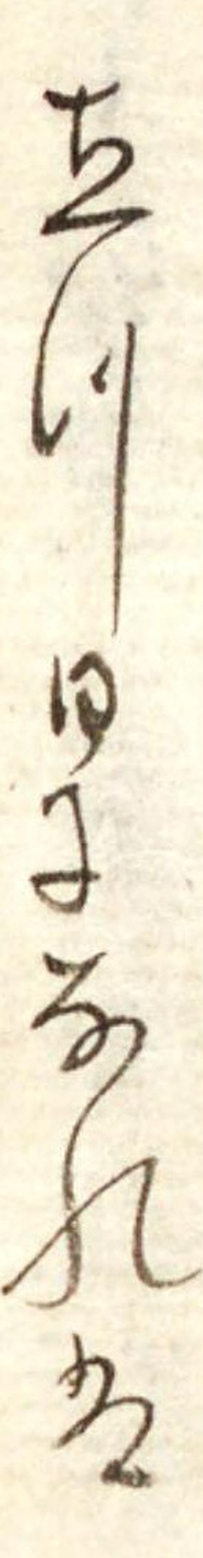立つ日になれは
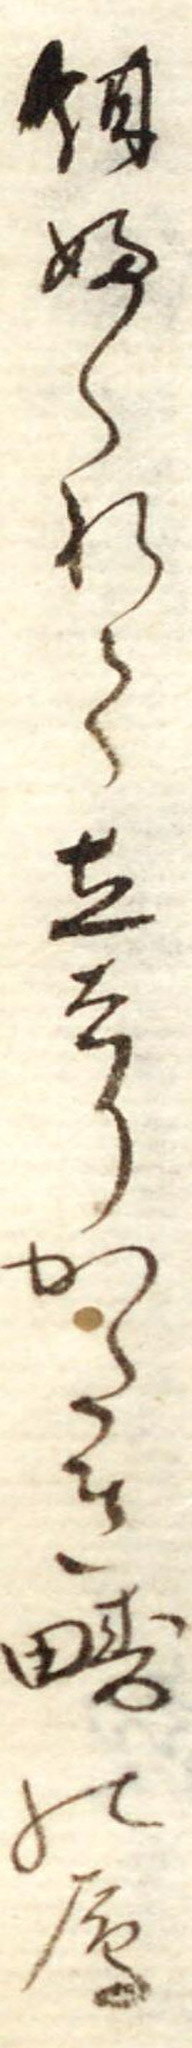飼ふくれて立去りかたき畴の鳫
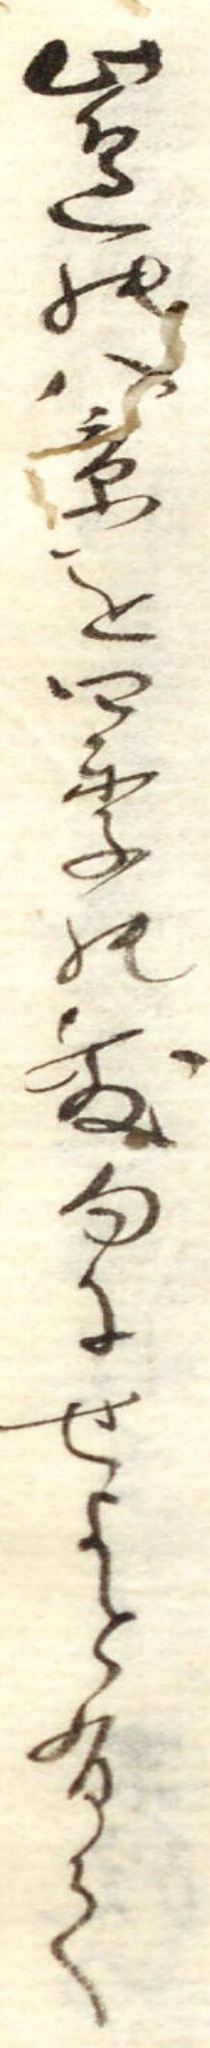此辺の八景を四季の発句にせよと有て
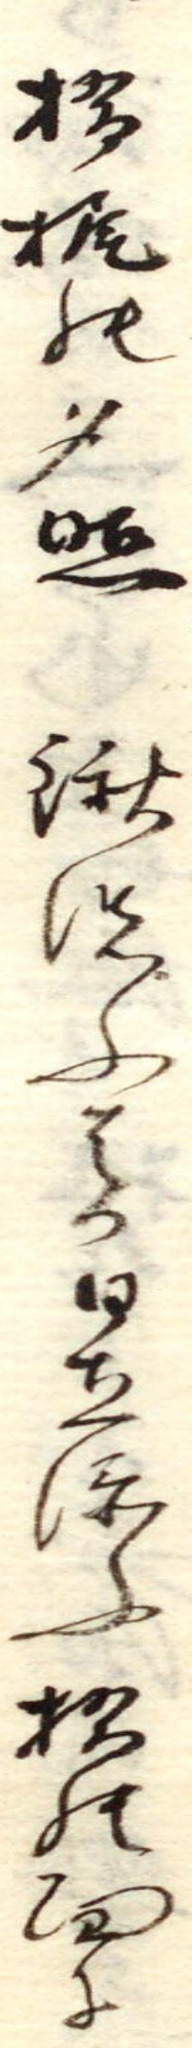橋梶の夕照鍬洗ふはる日立添ふ橋の面に
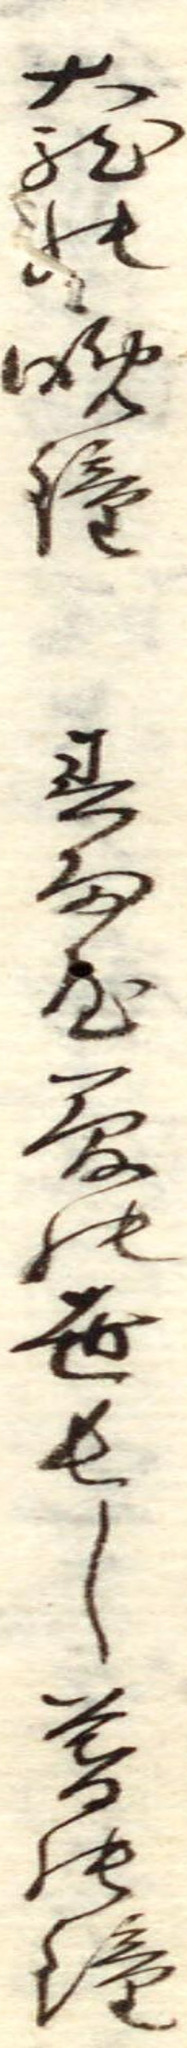大龍の晩鐘春雨や夢の世長し暮の鐘
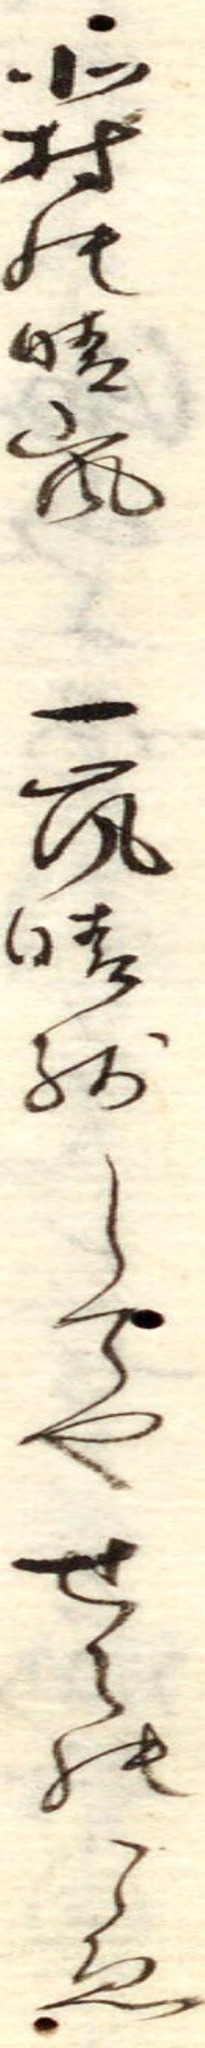北村の晴嵐一嵐晴残してやせみのこゑ
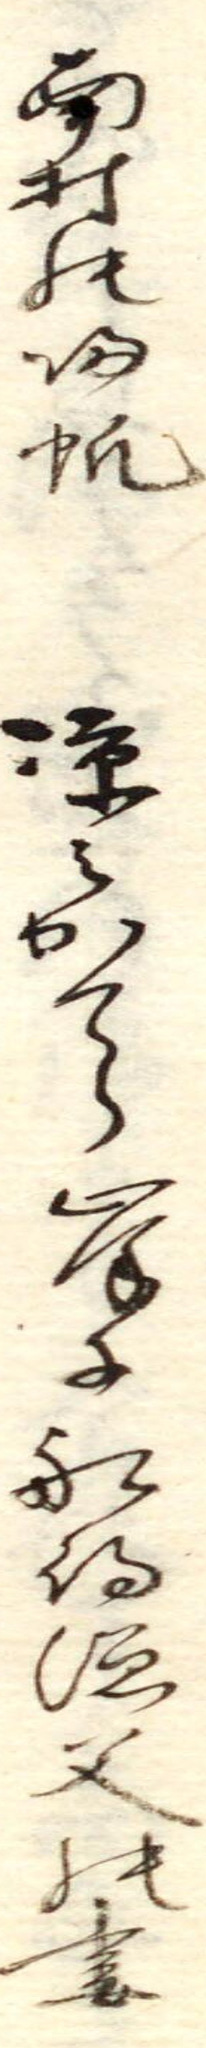南村の帰帆涼みかてら岸に船待漁父の妻
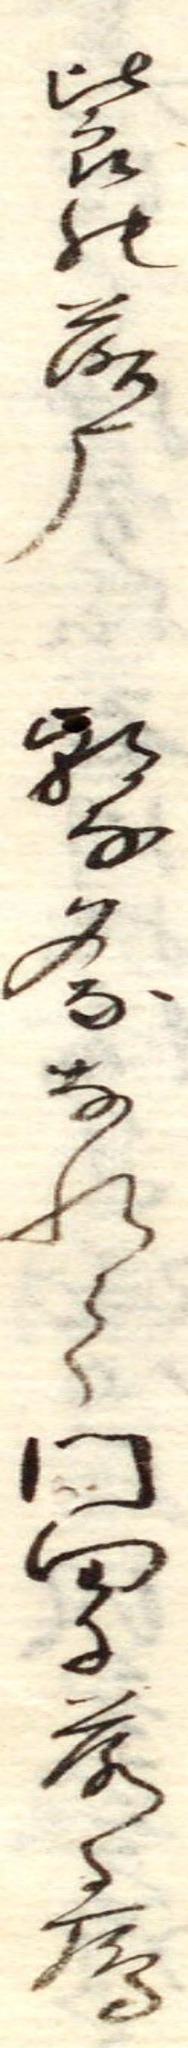比良の落鳫朝な夕ななれて門田に落る鳫
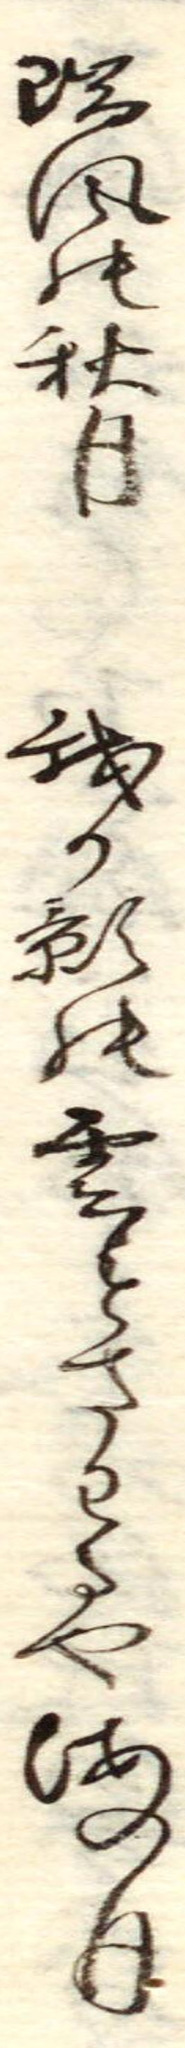瑞風の秋月我か影の雲とさわるや海の月
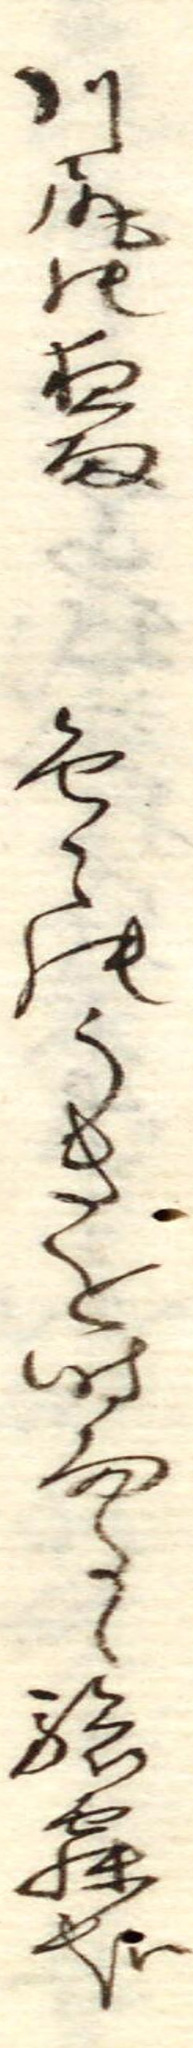川尻の夜雨色々のうきを時雨るゝ旅寢哉
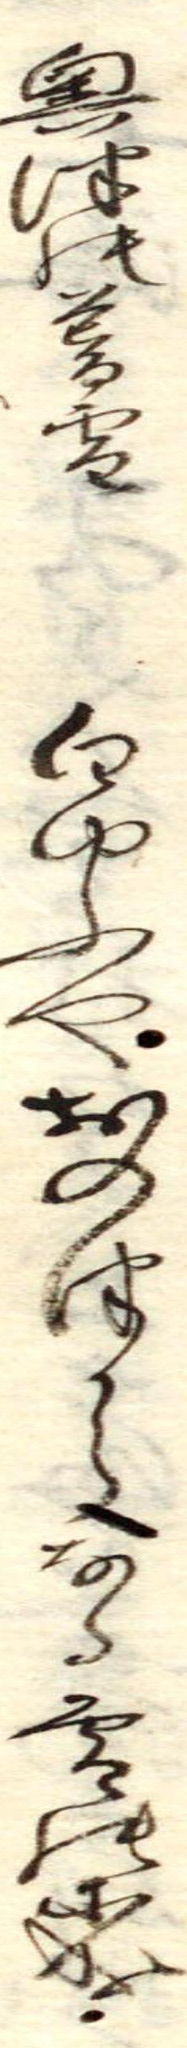奥津の暮雪白ゆふやおのつからなる雪の森

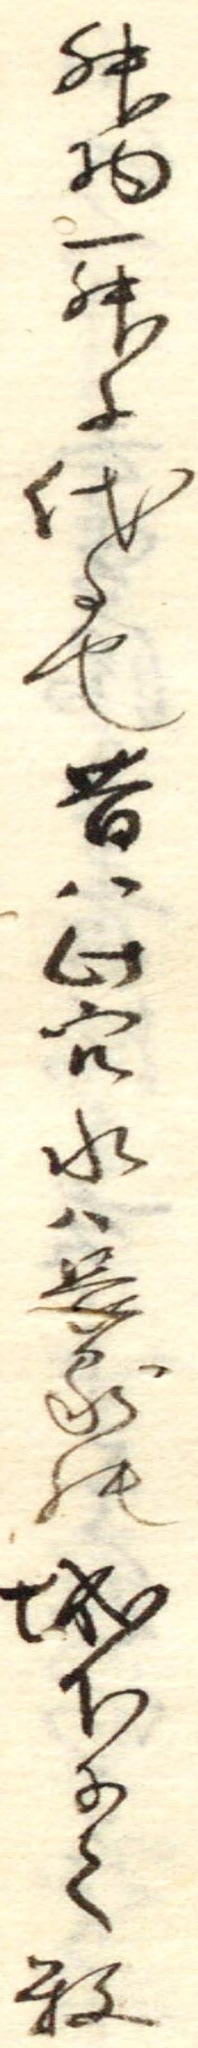升物一升に代る也昔は此穴水は長家の城下にて数
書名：能登名跡誌
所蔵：Ishikawa Prefectural Library
